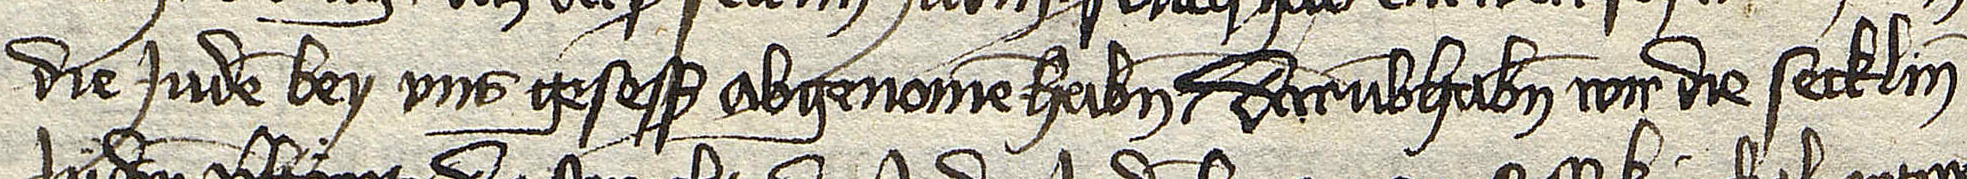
die Iude* bey vns geſeſſ* abgenome* habn* / Darub* habn* wir die ſecklin*
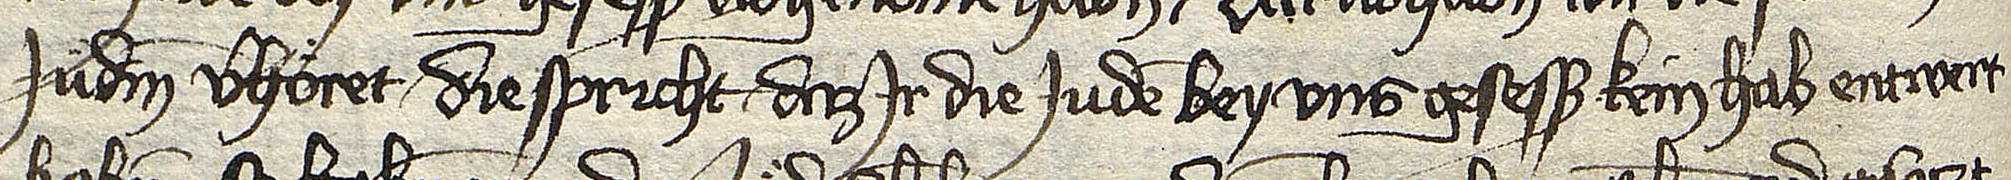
Iüdin* v*höret / Die ſpricht / daʒ Ir die Iude* bey vns geſeſſ* kein hab entwert
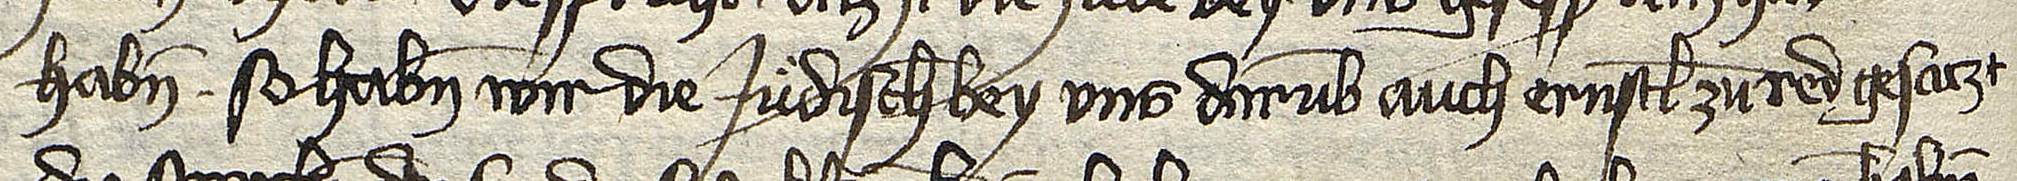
habn* . ſo habn* wir die Iüdiſch* bey vns darub* auch ernſtl* ʒu red geſacʒt
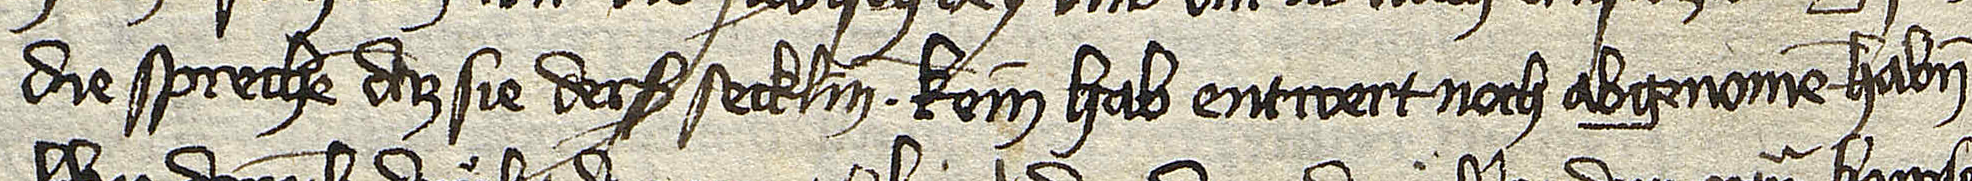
die ſpreche* daʒ ſie derſ* ſecklin* . kein hab entwert noch abgenome* habn*
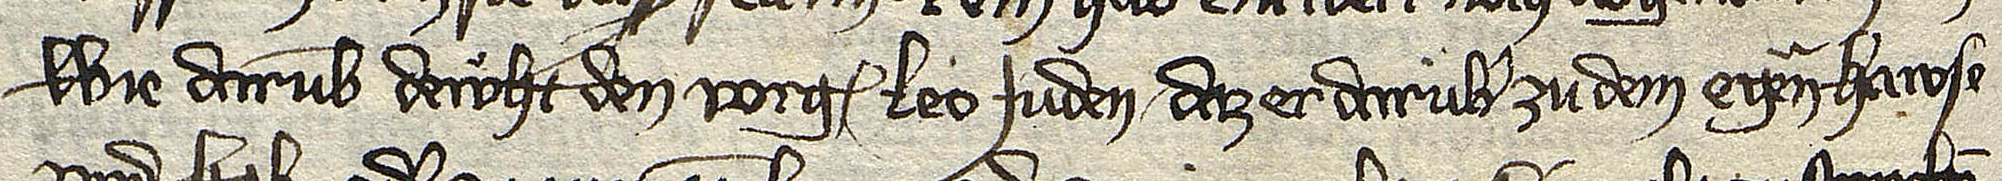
Wie darub* deẅht den vorg* leo Iuden / daʒ er darüb* ʒu dem egen* hawſe
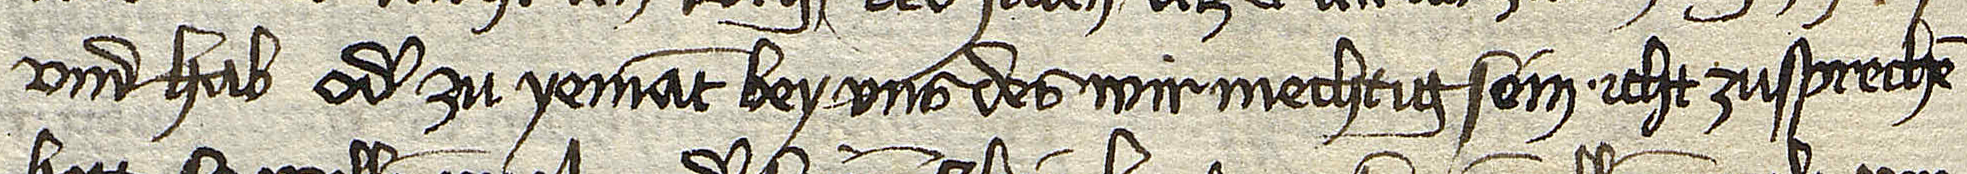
vnd hab od* ʒu yema*t bey vns des wir mechtig ſein . ichts ʒuſpreche*
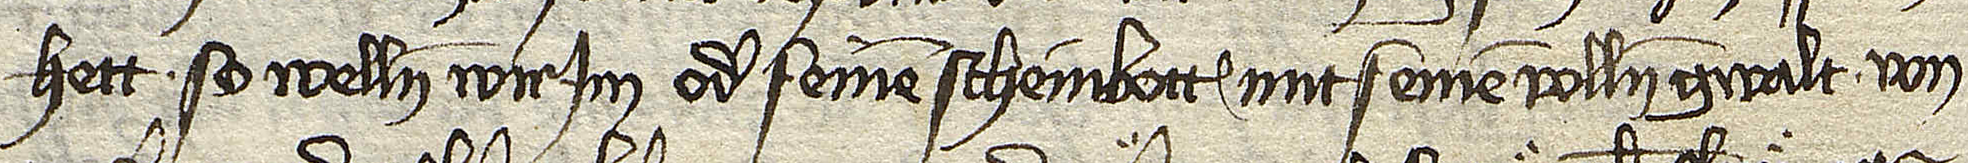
hett . ſo welln* wir Im od* ſeine* ſcheinbott* mit ſeine* volln* gwalt . von
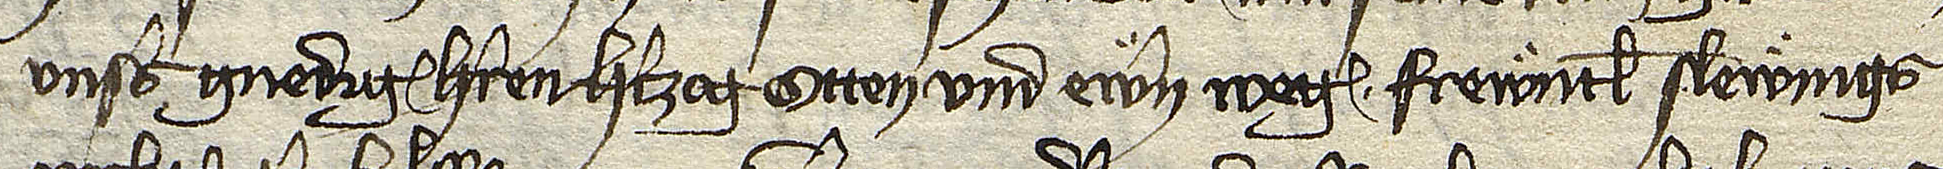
vnſs* gnedig* h*ren h*cʒog Otten vnd eẅ*n weg* . freẅntl* ſleẅnigs
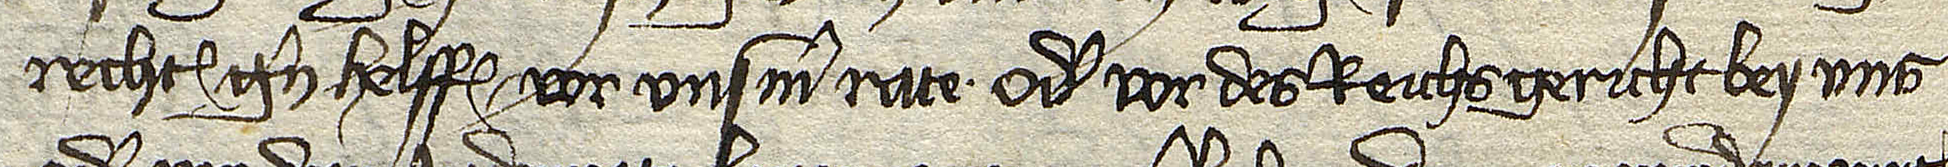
recht* g*n helff* / vor vnſm* rate . od* vor des Reichs gericht bey vns
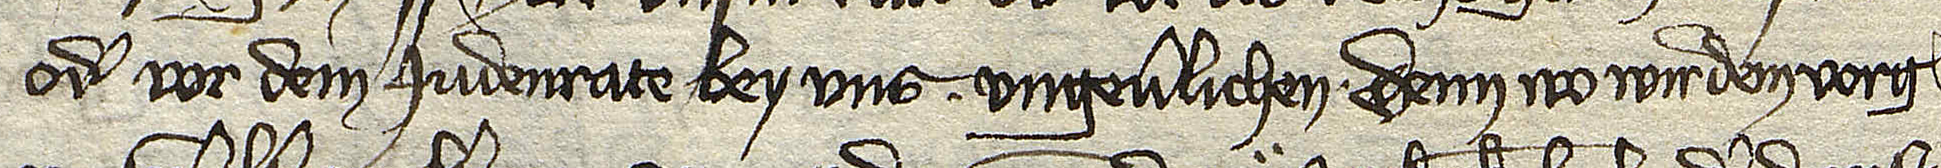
od* vor dem Iudenrate bey vns . vngeu*lichen . Denn wo wir dem vorg*
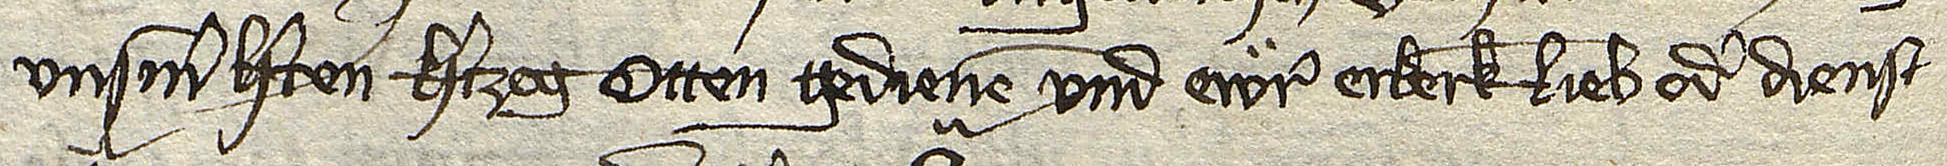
vnſm* h*ren h*cʒog Otten gediene* vnd eẅr* erberk* lieb od* dienſt
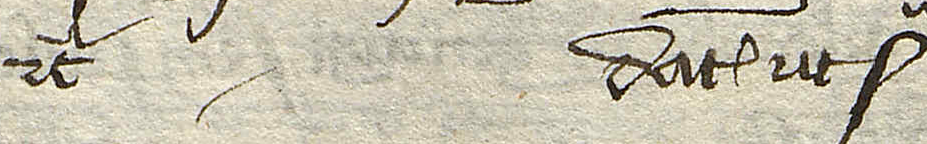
ec* / Dat* ut ſ*
